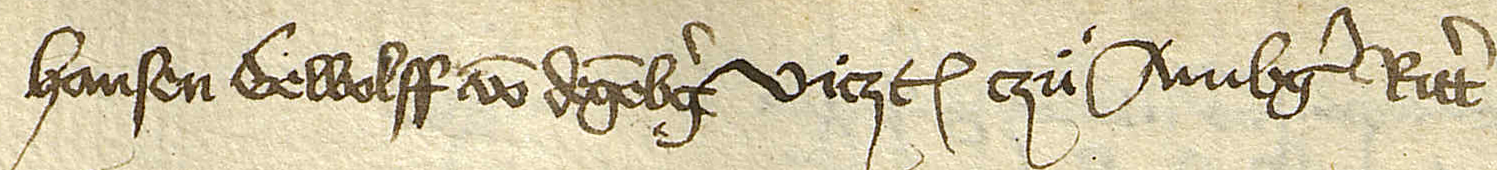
hanſen Gewolff vo* dege*bg* Vicʒt* cʒü Ambg* Rat
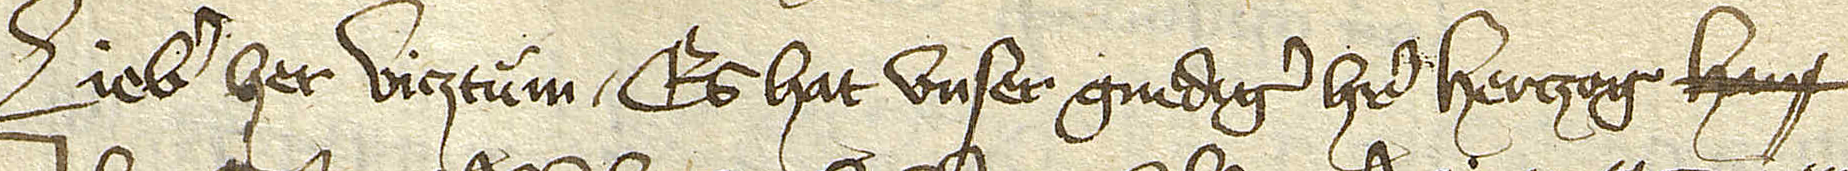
Lieb* her Vicʒtum / Es hat vnſr gnedig* hr* hercʒog hanſ
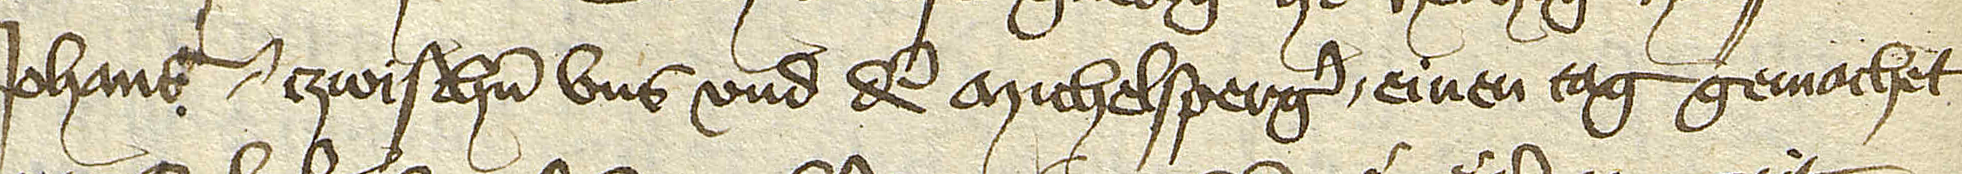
Iohans / cʒwiſchn* vns vnd d* Michelſperg* / einen tag gemachet
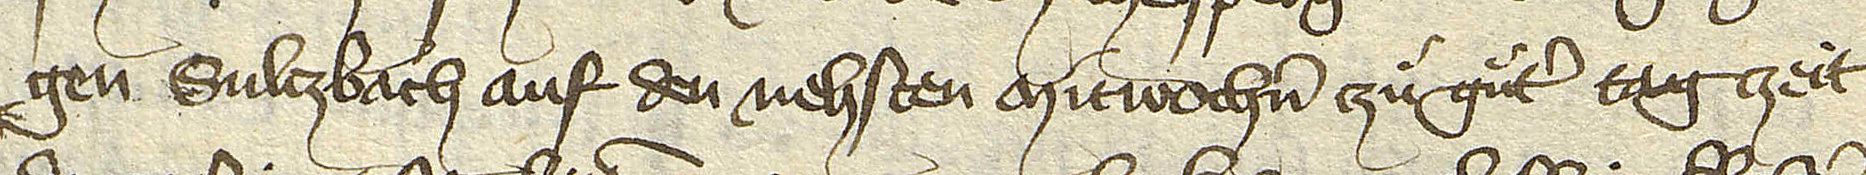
gen Sulcʒbach auf den nehſten Mitwochn* cʒü güt* tag cʒeit
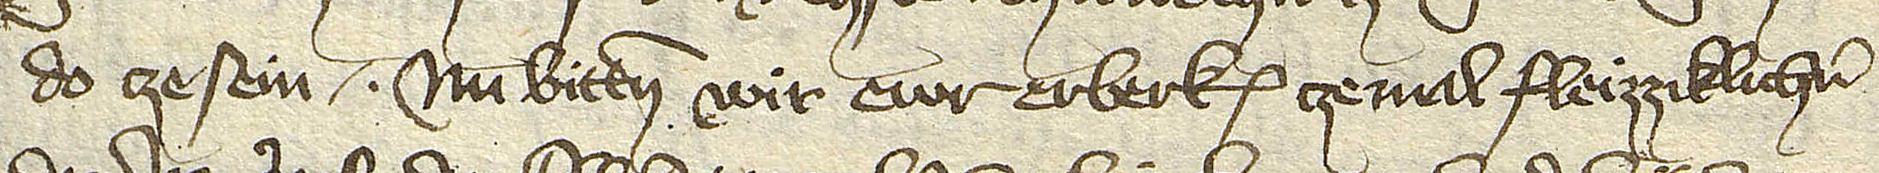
do cʒe ſein / . Nu bittn* wir ewr erberk* cʒemal fleiʒʒiklichn*
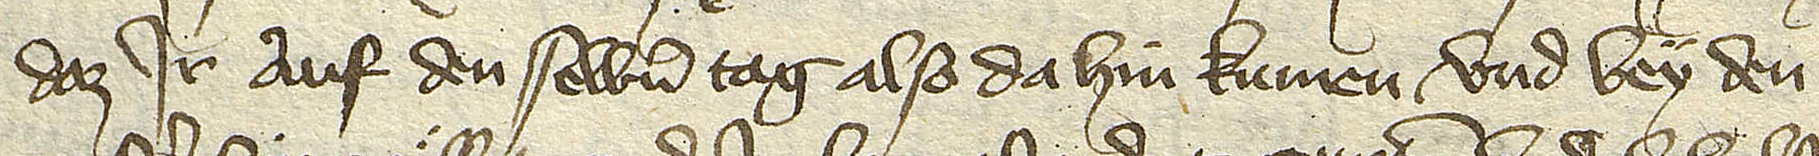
daʒ Ir Auf den ſelbn* tag alſo dahin kumen / vnd bey den
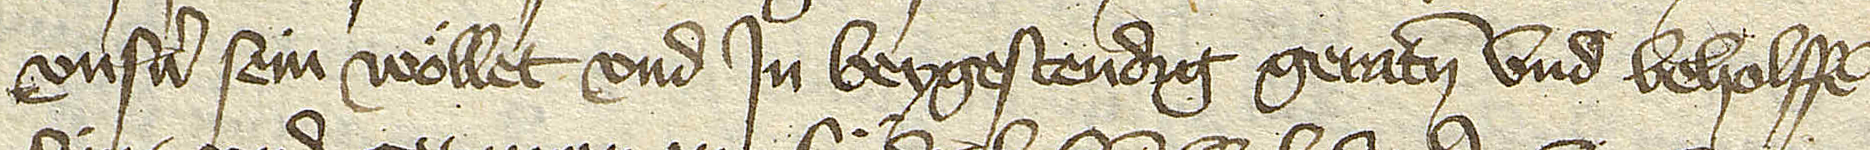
vnſn* ſein wöllet vnd In beygeſtendig geratn* vnd geholffe*
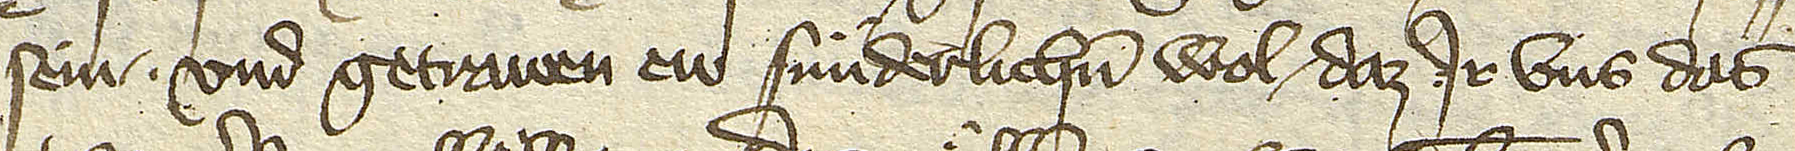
ſein / . vnd getrawen ew ſünderlichn* wol / daʒ Ir vns das
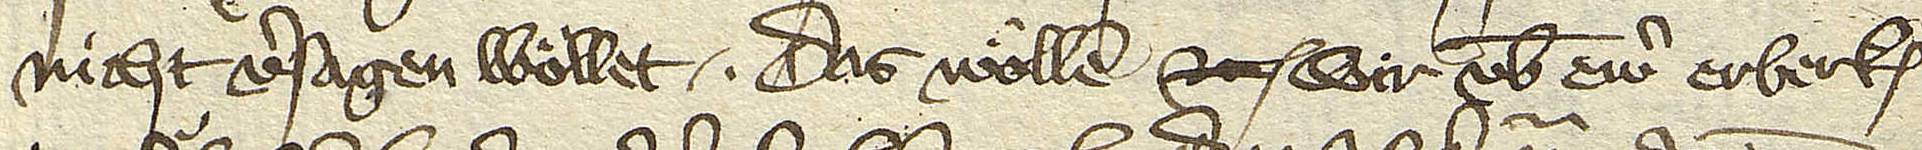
nicht v*ſagen wöllet / . Das wölle* ec* wir vb* ew* erberk*
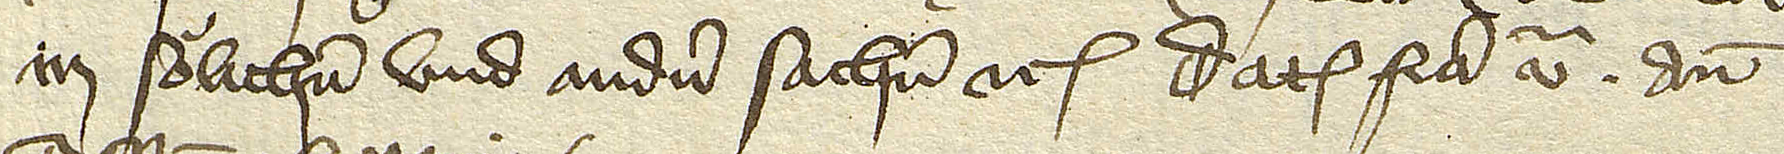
in ſölichn*vnd andn* ſachn* ec* Dat* fia* v* . An*
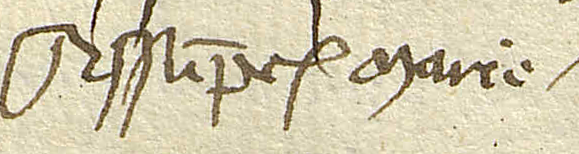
Aſſupc* Marie /
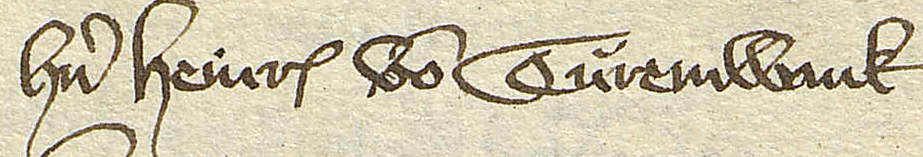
hn* heinr* vo* Türemwank
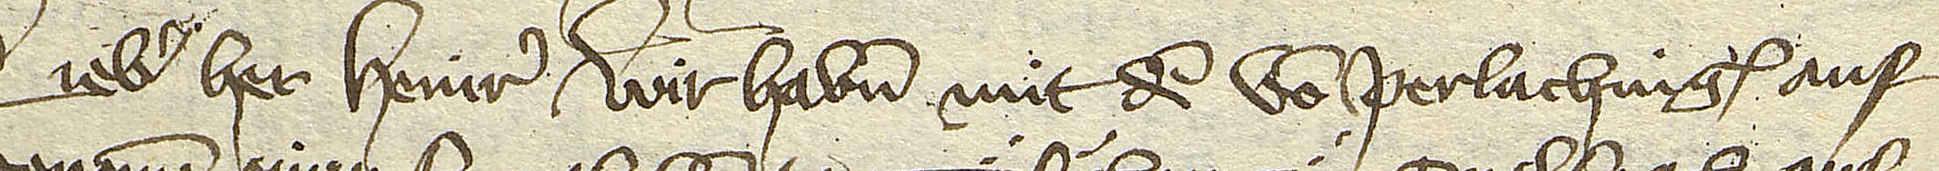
Lieb* her heinr* / Wir habn* mit d* vo* Perlaching* auf
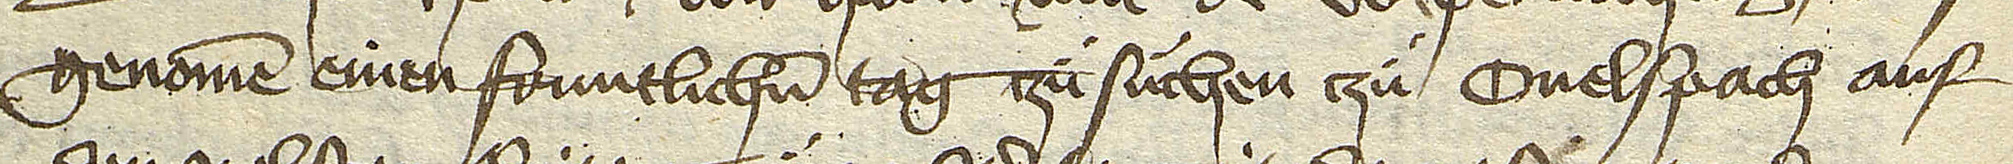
genome* einen fruntlichn* tag cʒü ſüchen cʒü Onelſpach auf
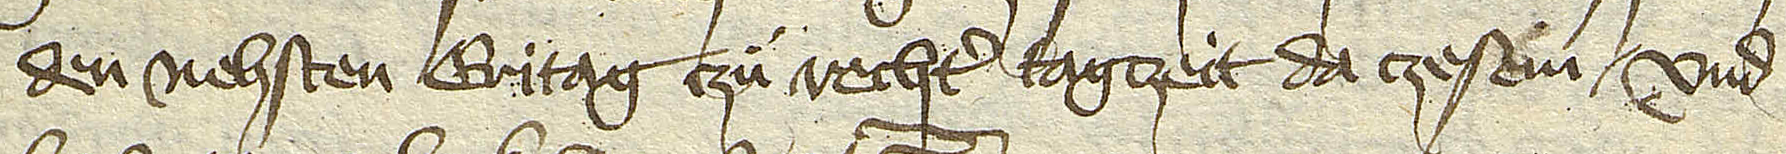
den nehſten Eritag cʒü recht* tagcʒeit da cʒeſein / vnd
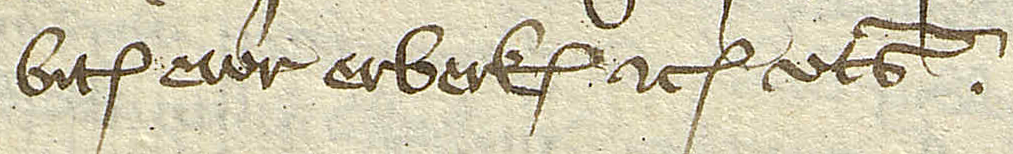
bit* ewr erberk* ec* vts* .
